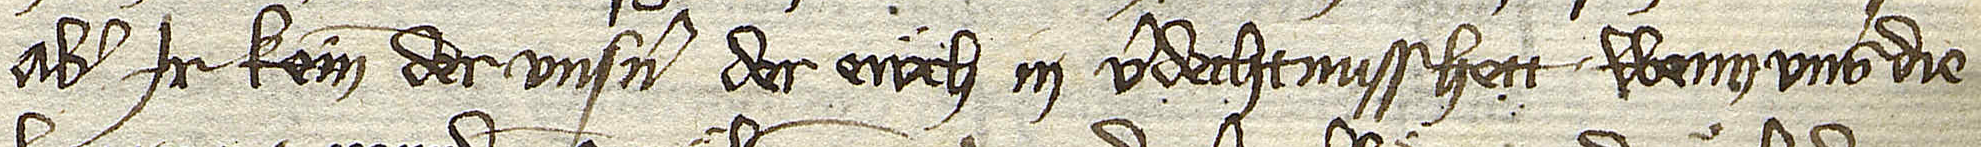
ab* Ir kein* der vnſn* der eẅch in v*dechtnuſſ hett / Wenn vns die
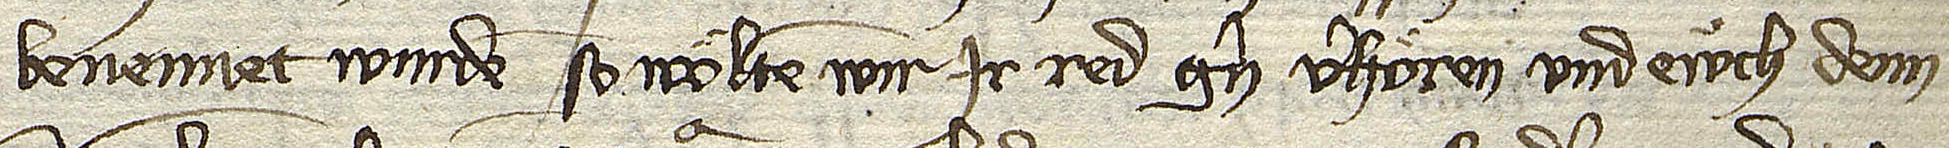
benennet wurde* ſo wölte* wir Ir red g*n v*hören vnd eẅch denn
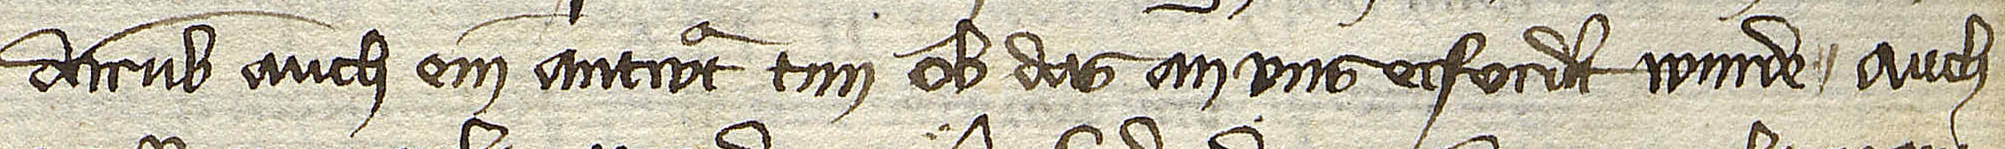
darub* auch ein antw*t tun ob das an vns erford*t wurde / auch
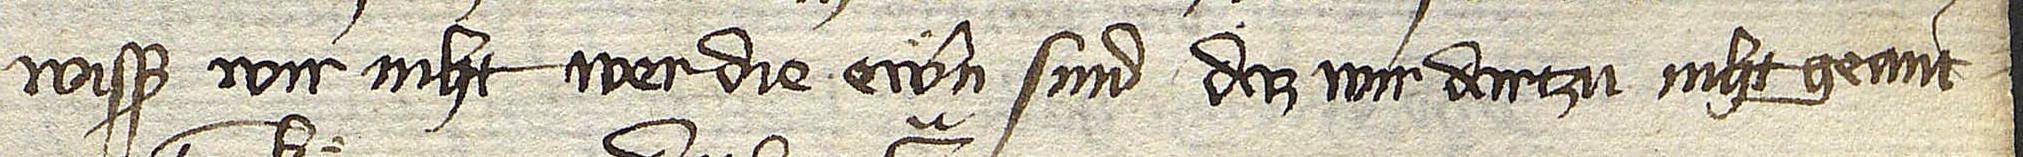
wiſſ* wir niht wer die eẅ*n ſind / daʒ wir darcʒu niht geant =
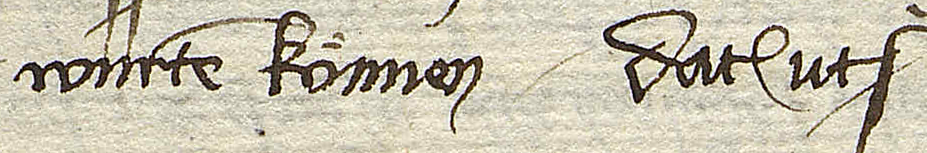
wurte* können / Dat* ut ſ*
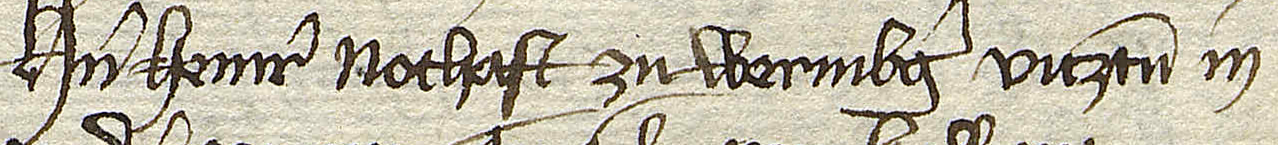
Hn* heinr* Nothaft ʒu Wermb*g vicʒtu* in
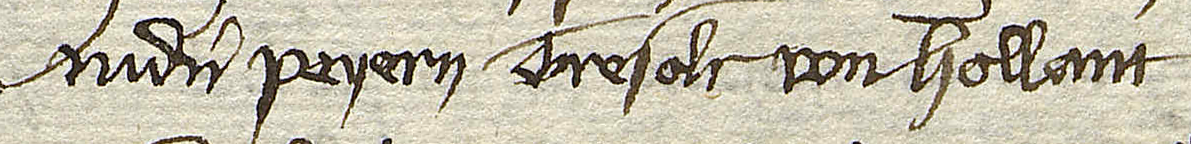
nidn* peyern Treſolr von hollant
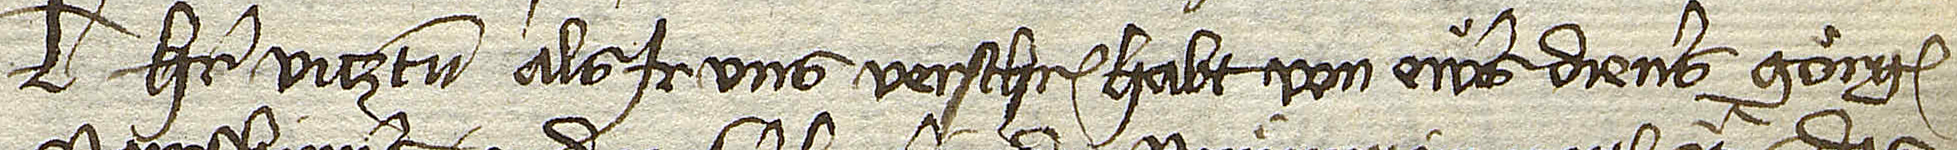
L* hr* vicʒtu* als Ir vns verſchr* habt von eẅ*s dien*s görg*
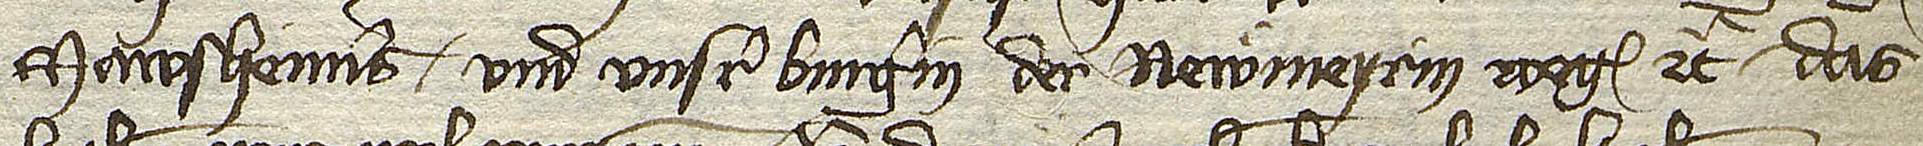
Mawſheim*s / vnd vnſr* burg*in der Neẅmeyrin weg* ec* / das
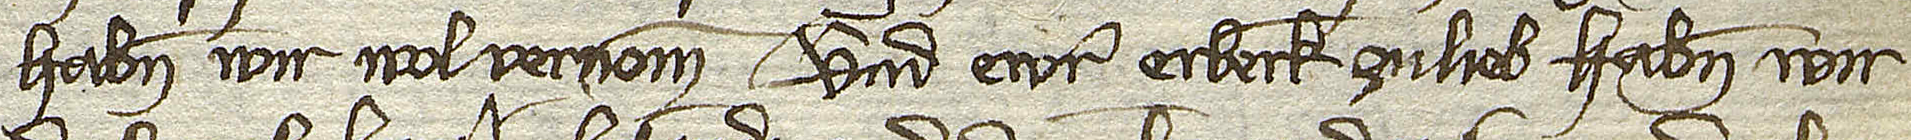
habn* wir wol vernom* / Vnd eẅr* erberk* ʒulieb habn* wir
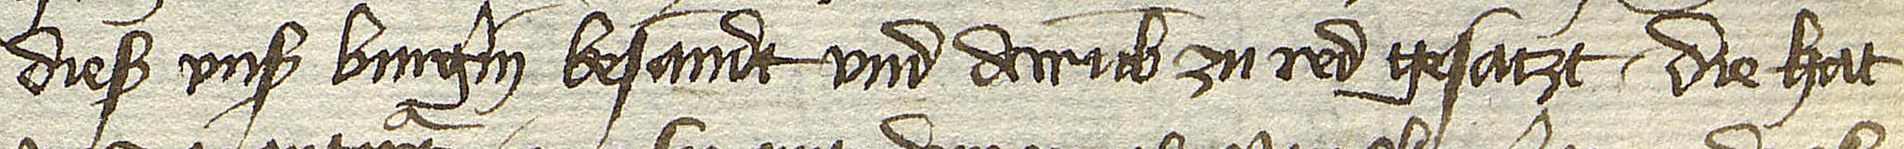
dieſ* vnſ* burg*in beſandt vnd darub* ʒu red geſacʒt / Die hat
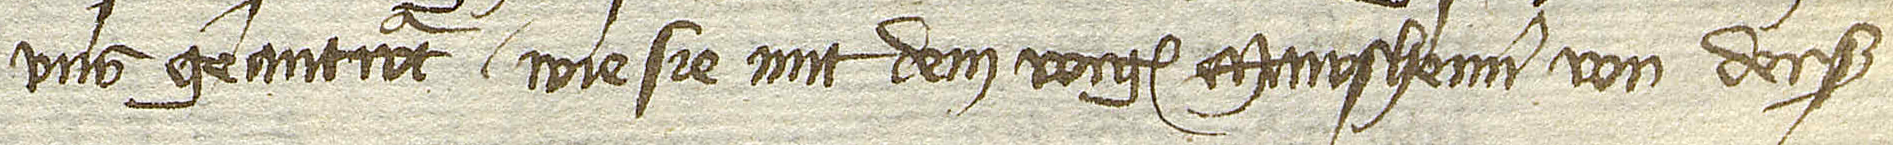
vns geantw*t / wie ſie mit dem vorg* Mawſheim* von derſ*
